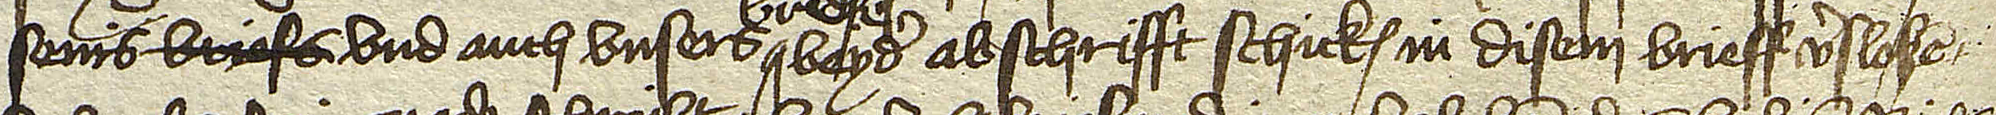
ſeins briefs vnd auch vnſers / beyd* abſchrifft ſchicke* in diſem brieff v*ſloſʒe* /
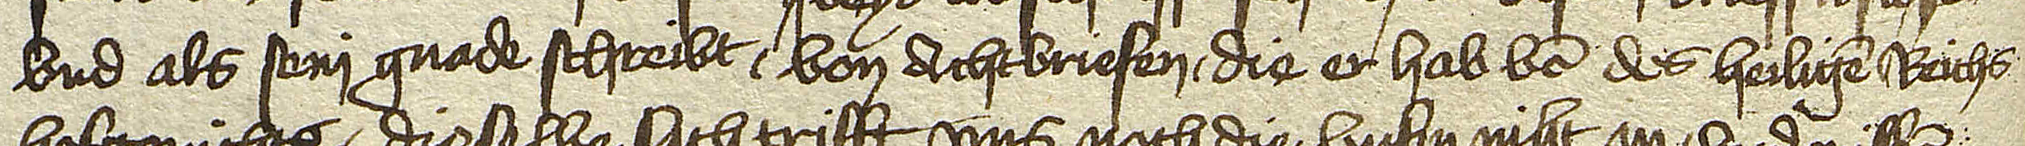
vnd als ſein gnade ſchreibt / von Achtbriefen / die er hab vo* des heilige* Reichs
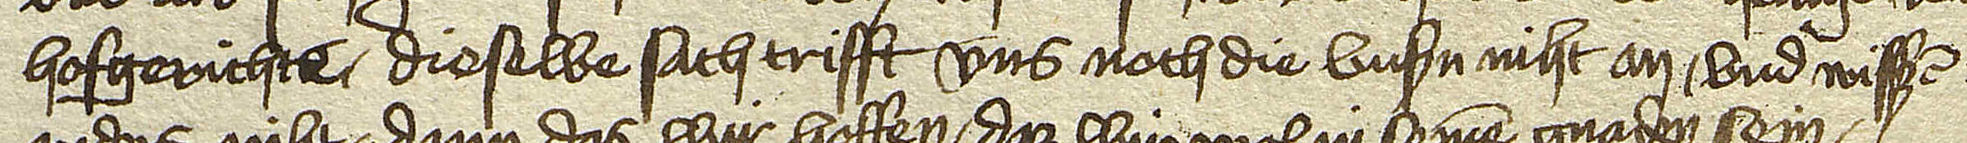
hofgerichte / dieſelbe ſach trifft vns noch die vnſ*n niht an / vnd wiſſʒe*
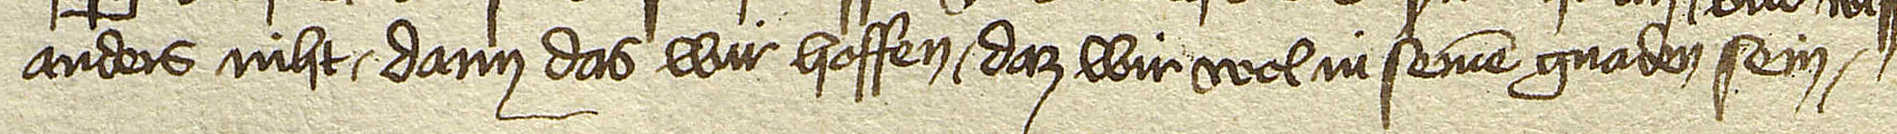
anders niht / dann das wir hoffen / daʒ wir wol in ſeine* gnaden ſein /
